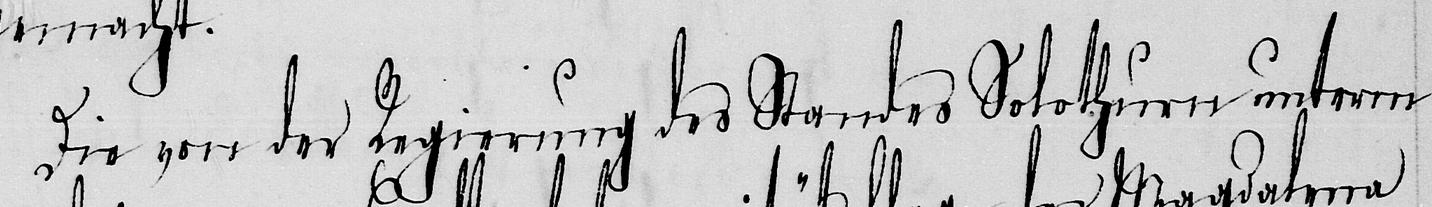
Die von der Regierung des Standes Solothurn unterm
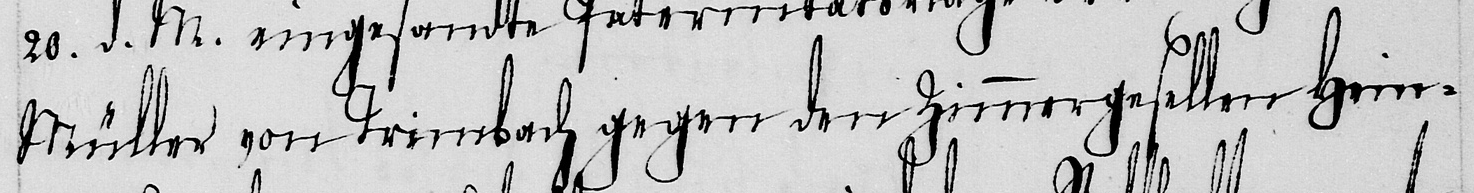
Müller von Trimbach gegen den Zimmergesellen Hein¬
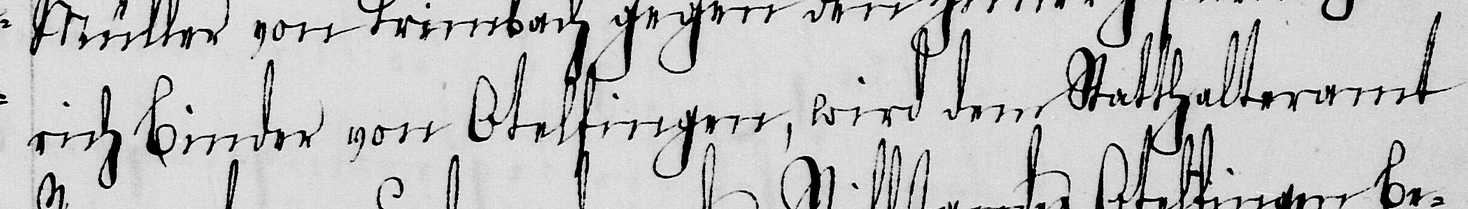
rich Binder von Otelfingen, wird dem Statthalteramt
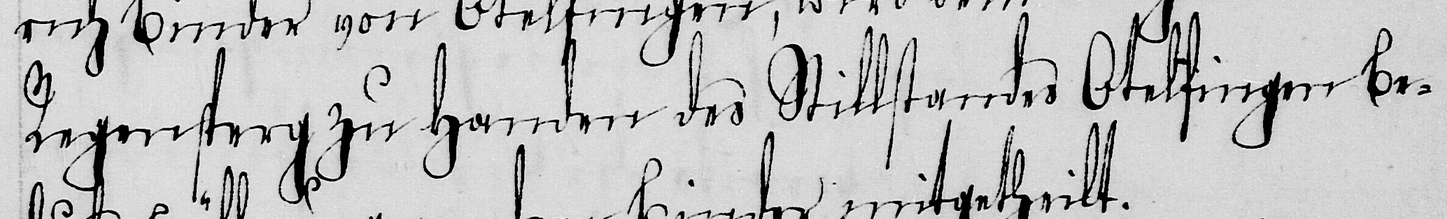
Regensperg zu Handen des Stillstandes Otelfingen Be¬
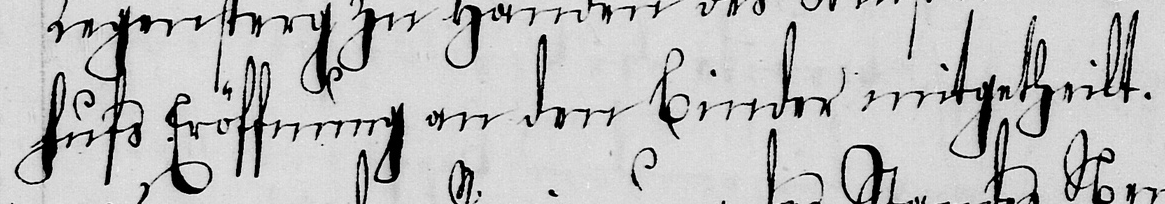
hufs Eröffnung an den Binder mitgetheilt.
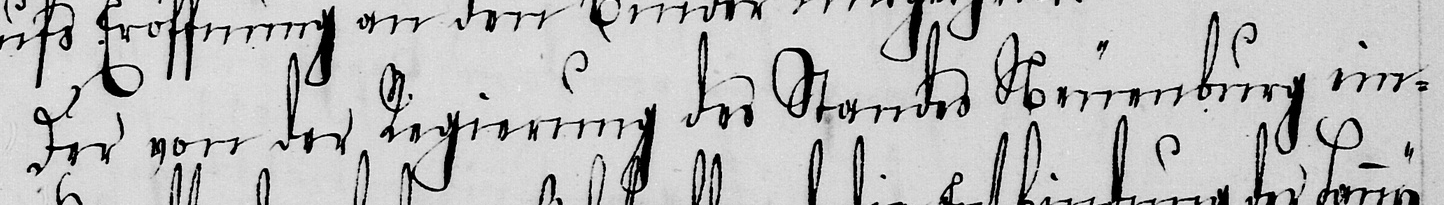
Der von der Regierung des Standes Neuenburg ein¬
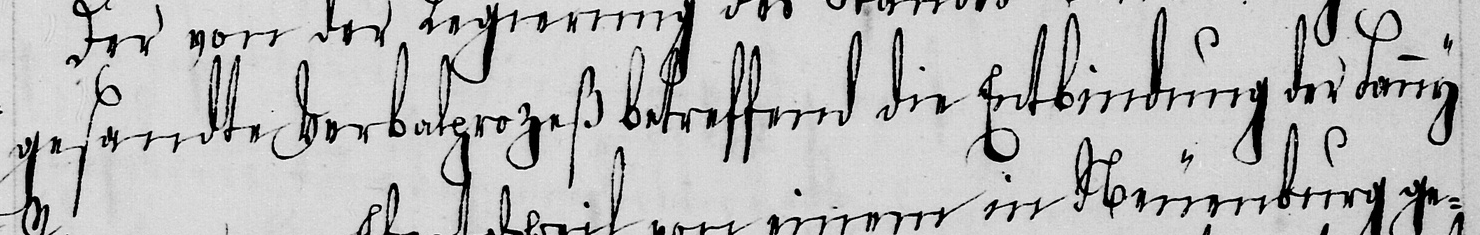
gesandte Verbalproceß betreffend die Entbindung der Fan¬
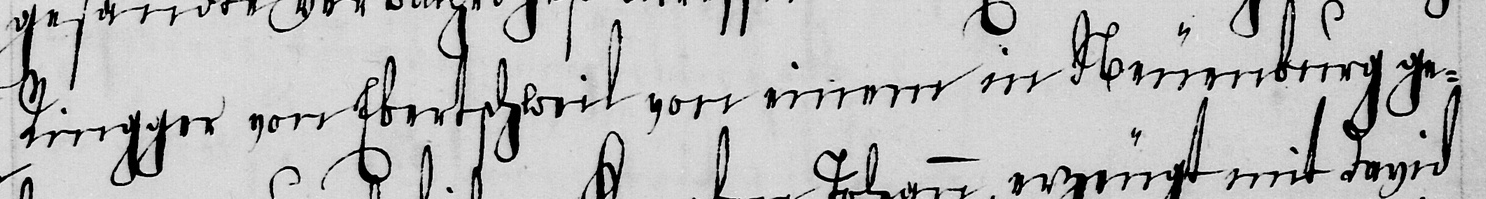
Ringger von Ebertschweil von einem in Neuenburg ge¬
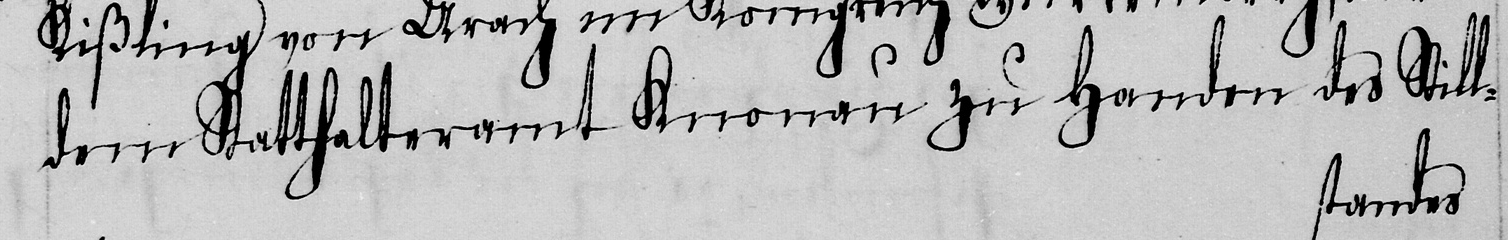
dem Statthalteramt Knonau zu Handen des Stil¬
